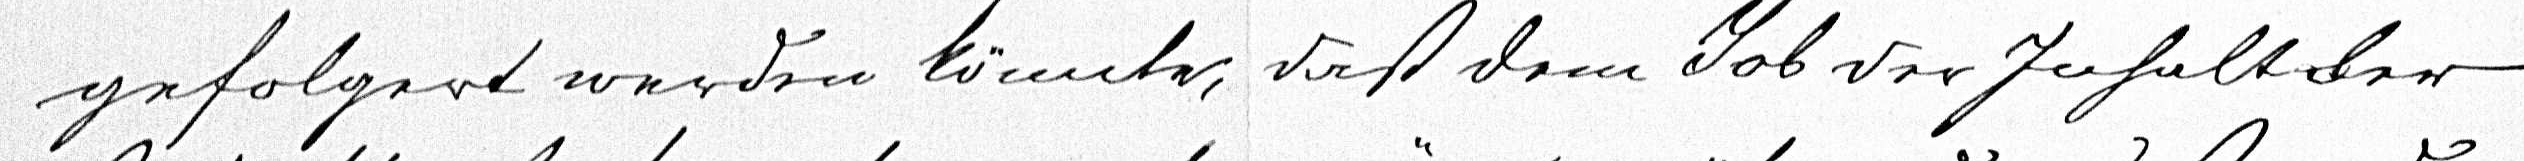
gefolgert werden könnte, daß dem Job der Inhalt der
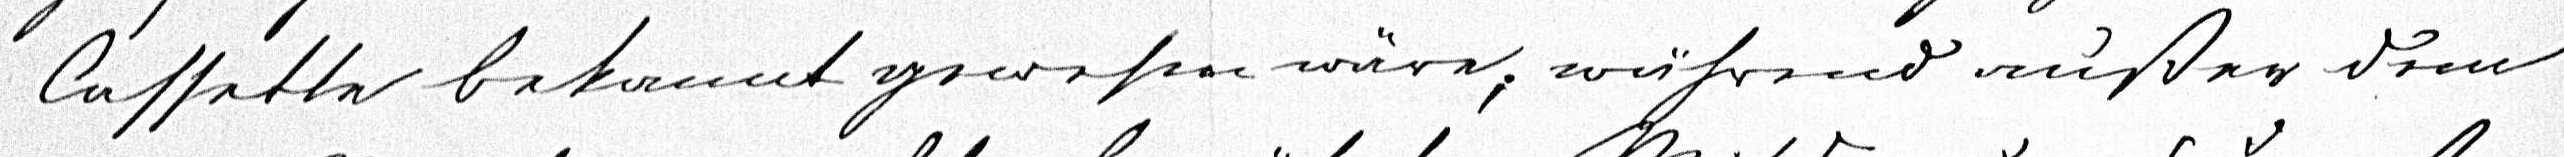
Cassette bekannt gewesen wäre; während außer dem
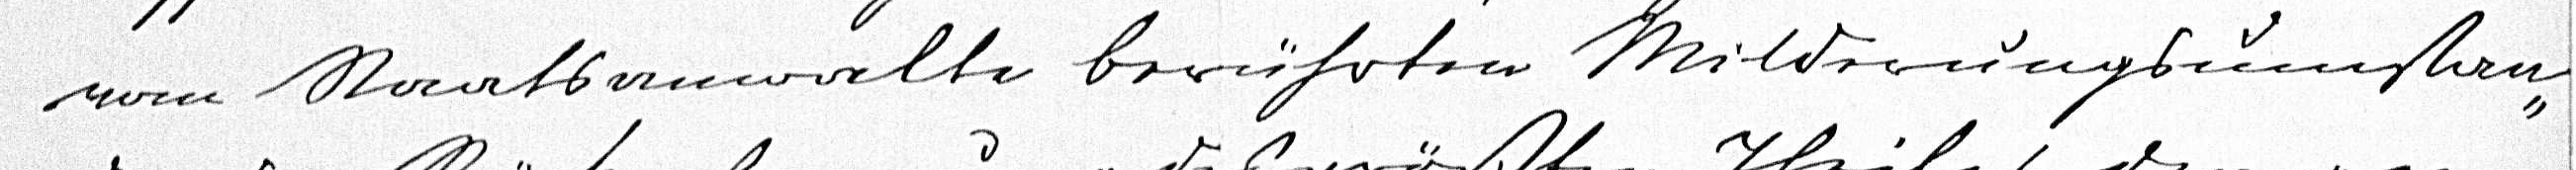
vom Staatsanwalte berührten Milderungsumstan¬
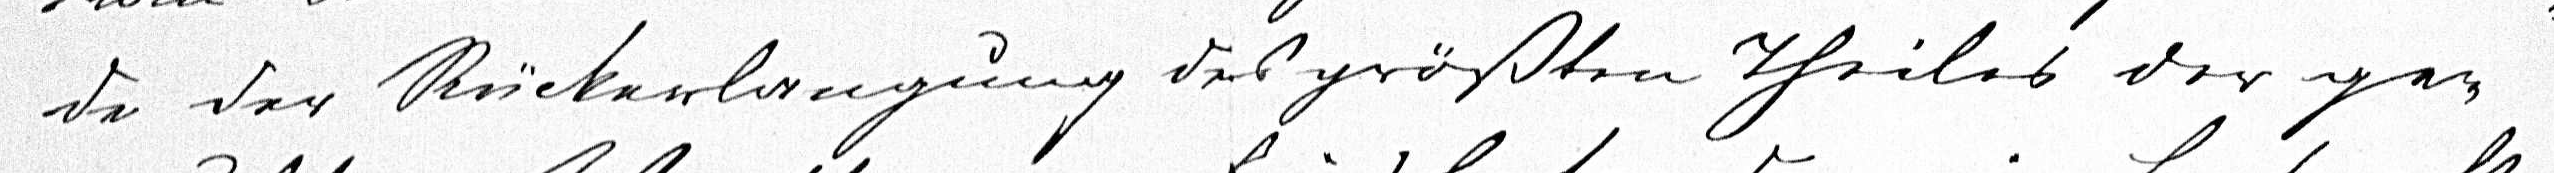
de der Rückerlangung des größten Theiles der ge¬
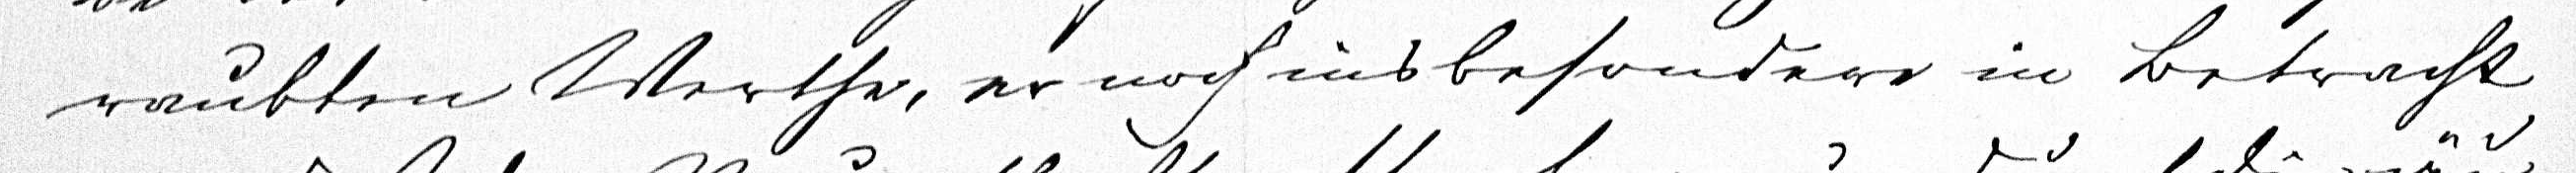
raubten Werthe, er noch insbesondere in Betracht
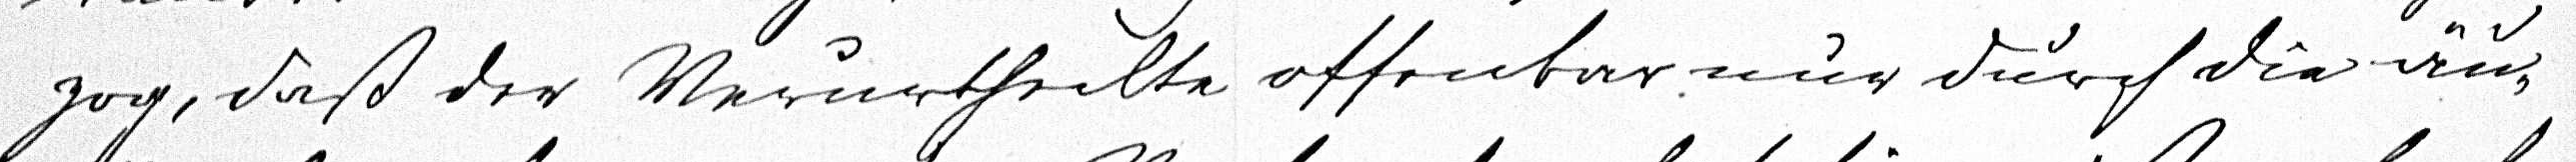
zog, daß der Verurtheilte offenbar nur durch die äu¬
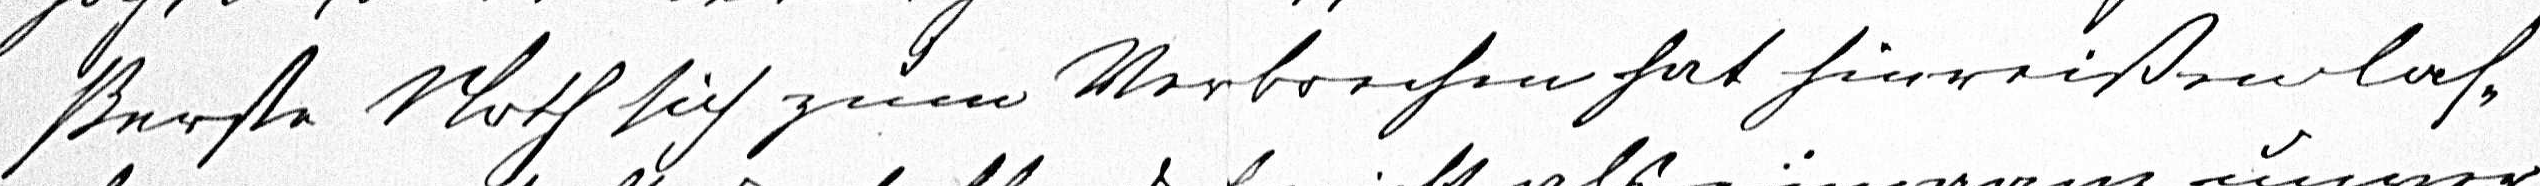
ßerste Noth sich zum verbrechen hat hinreißen las¬
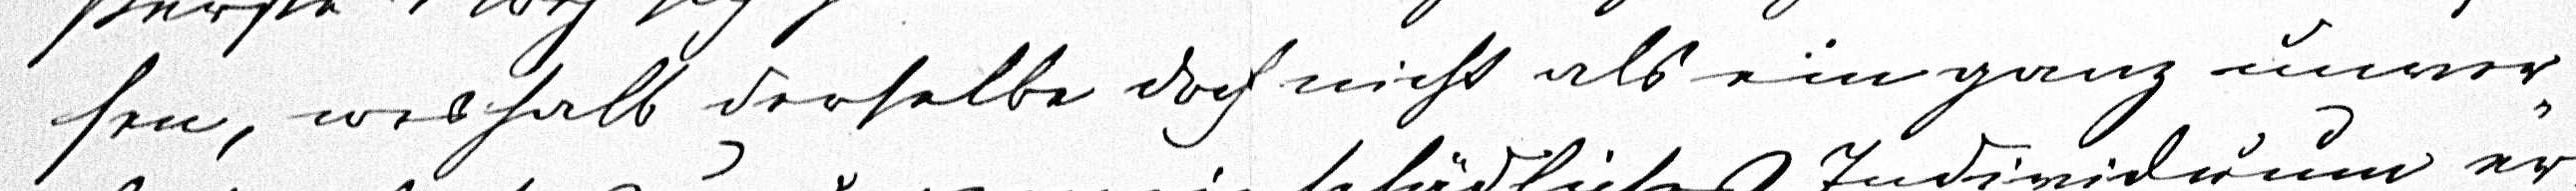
sen, weshalb derselbe doch nicht als ein ganz unver¬
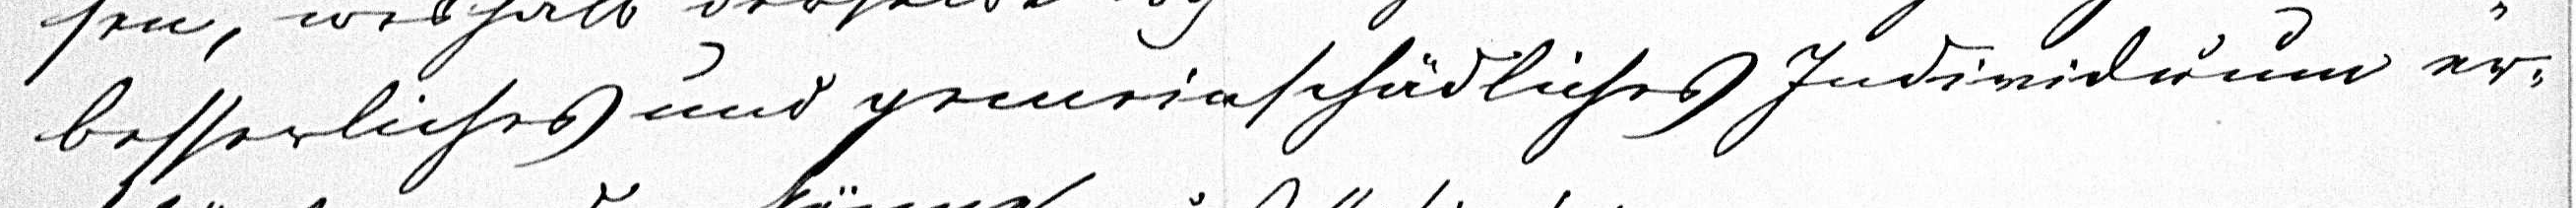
besserliches und gemeinschädliches Individuum er¬
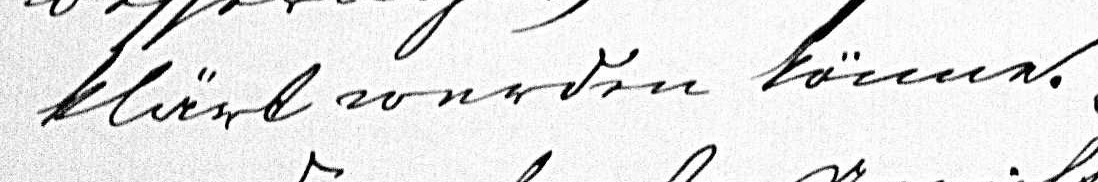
klärt werden könne.
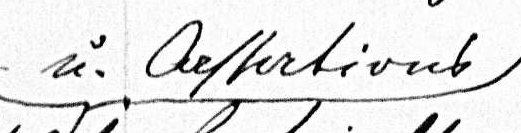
u. Cassations
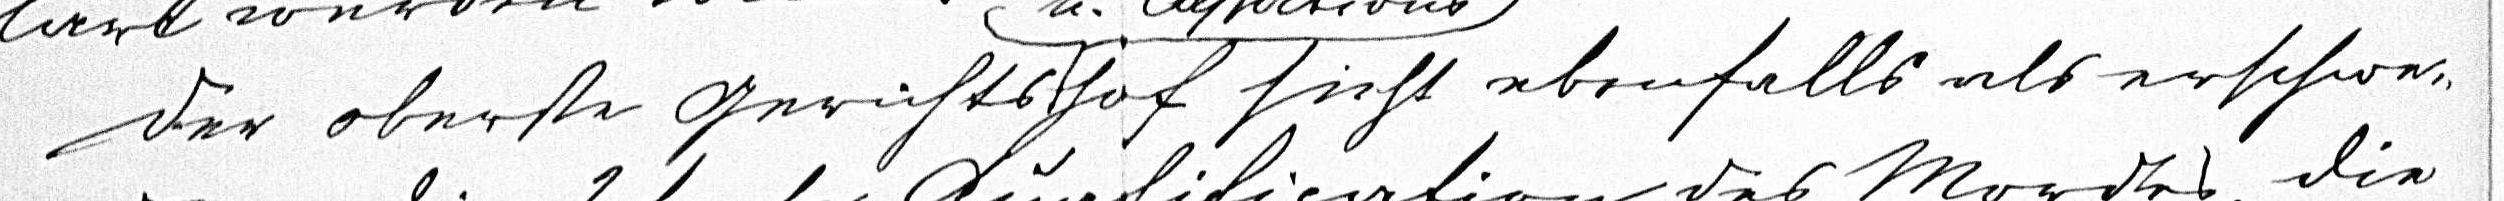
Der oberste Gerichts- hof sieht ebenfalls als erschwe¬
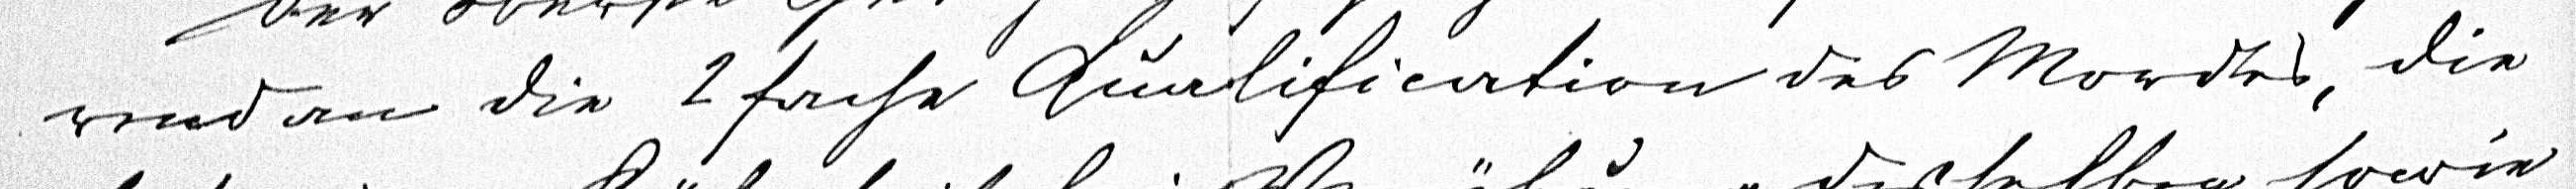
rend an die 2fache Qualification des Mordes, die
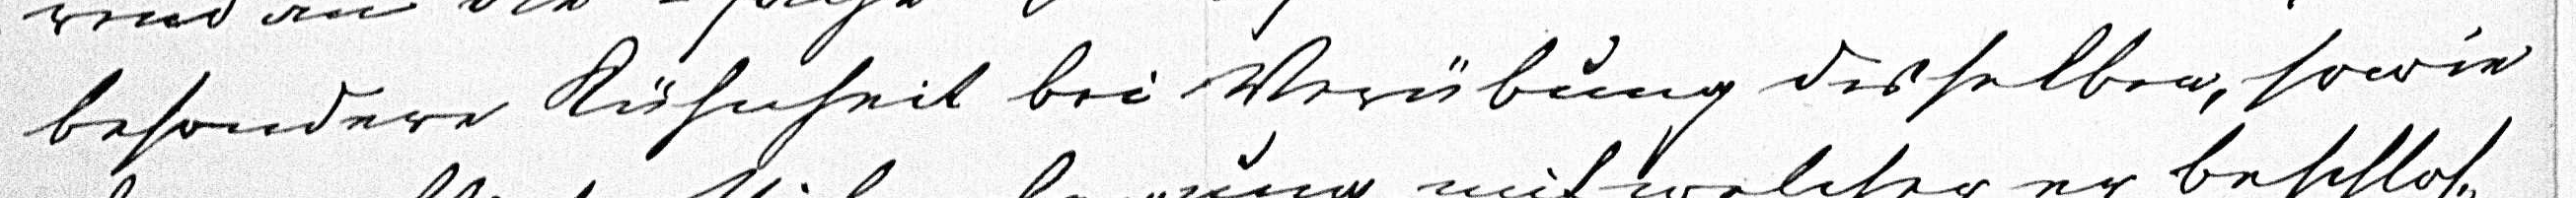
besondere Kühnheit bei Verübung desselben, sowie
